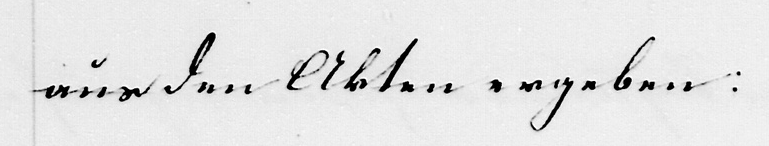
aus den Akten ergeben:
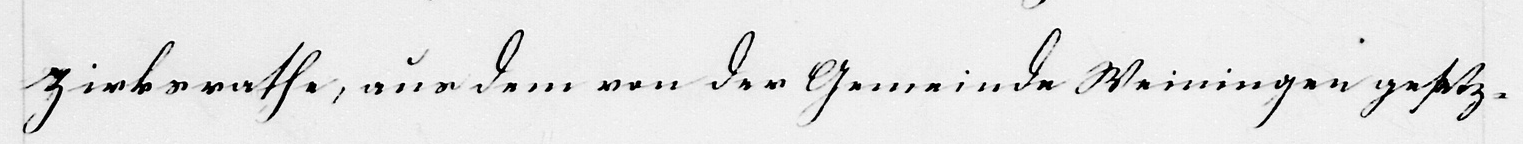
zirksrathe, aus dem von der Gemeinde Weiningen gesetz¬
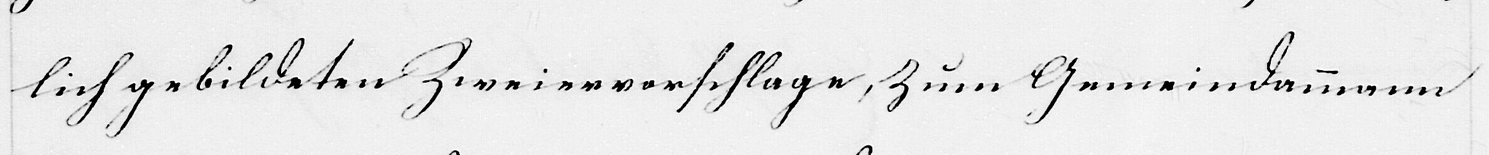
lich gebildeten Zweiervorschlage, zum Gemeindammann
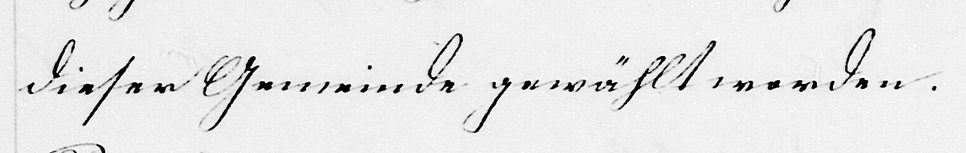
dieser Gemeinde gewählt worden.
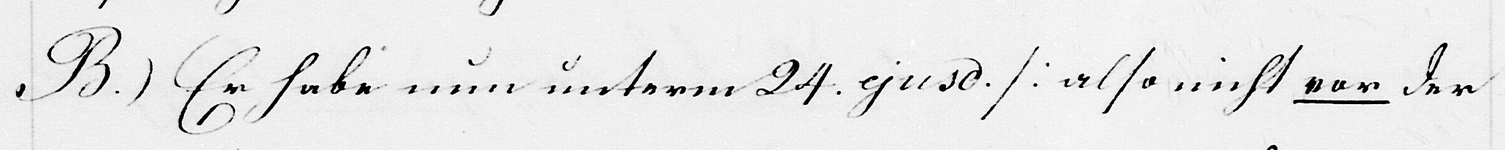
B.) Er habe nun unterm 24. ejusd. [also nicht vor der
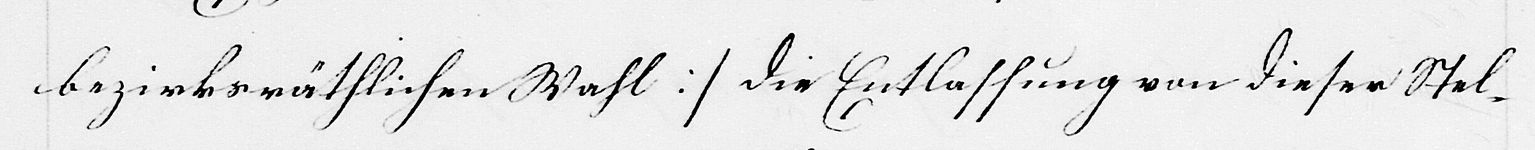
bezirksräthlichen Wahl] die Entlassung von dieser Stel¬
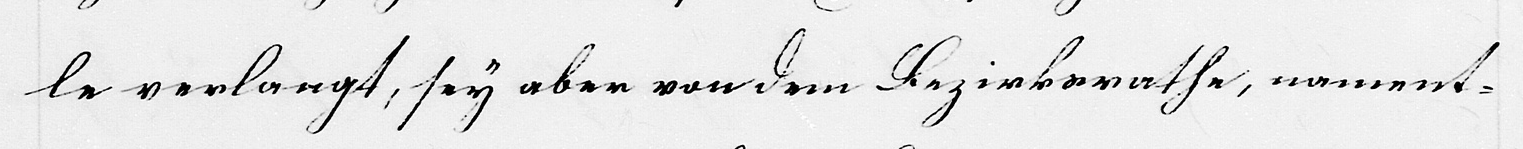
le verlangt, sey aber von dem Bezirksrathe, nament¬
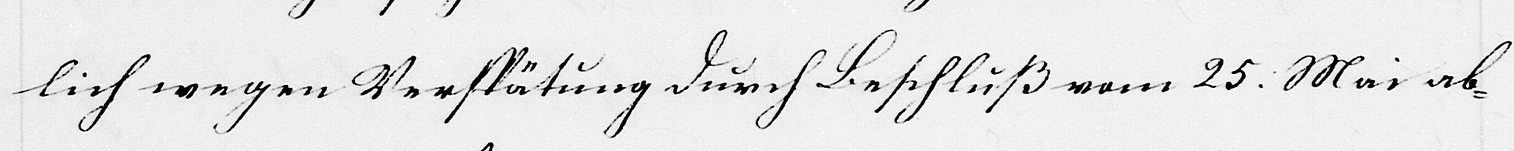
lich wegen Verspätung durch Beschluß vom 25. Mai ab¬
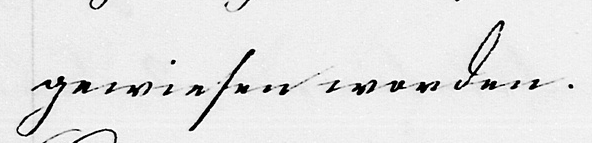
gewiesen worden.
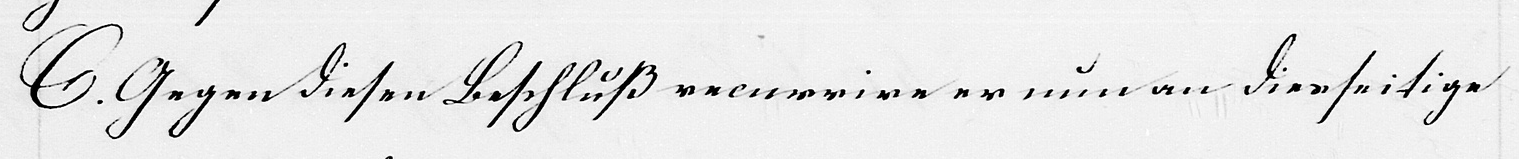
C. Gegen diesen Beschluß recurrire er nun an diesseitige
